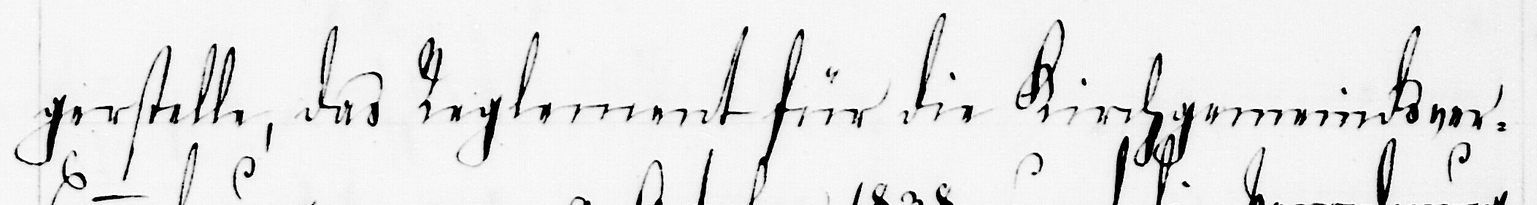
gerstelle, das Reglement für die Kirchgemeindsver¬
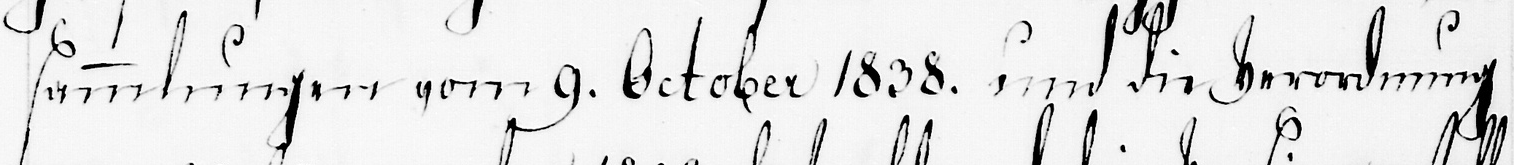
sammlungen vom 9. October 1838. und die Verordnung
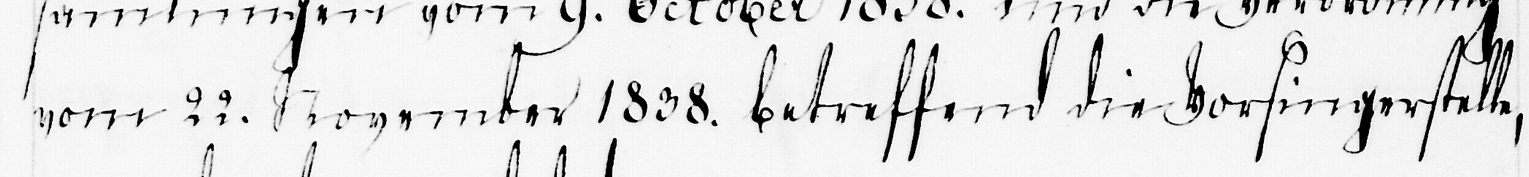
vom 22. November 1838. betreffend die Vorsingerstel¬
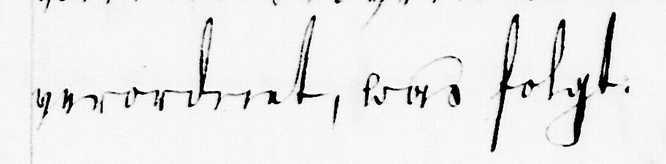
verordnet, was folgt.
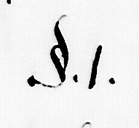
§. 1.
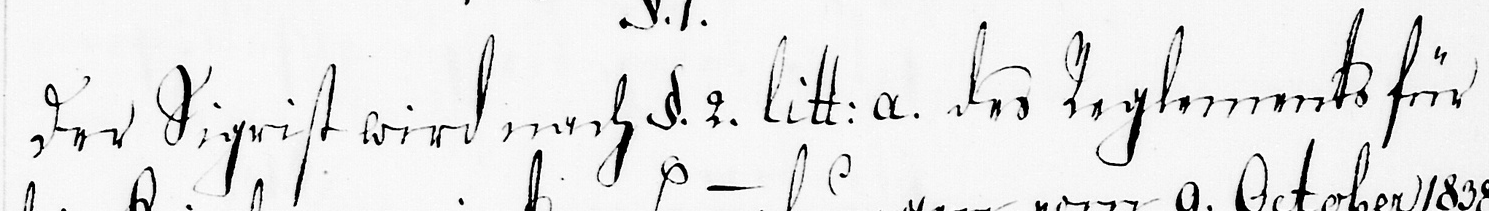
Der Sigrist wird nach §. 2. litt: a. des Reglements für
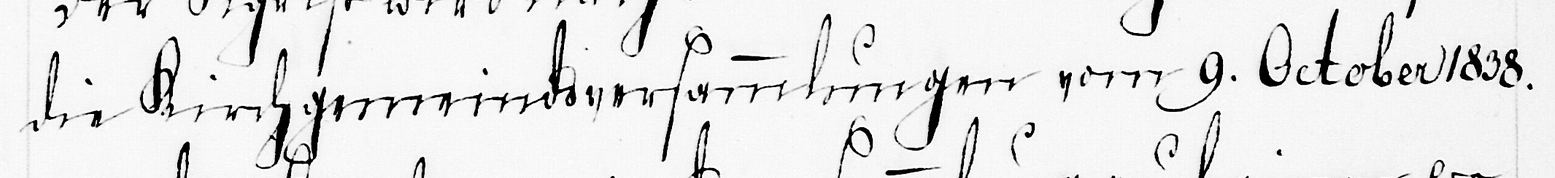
die Kirchgemeindsversammlungen vom 9. October 1838.
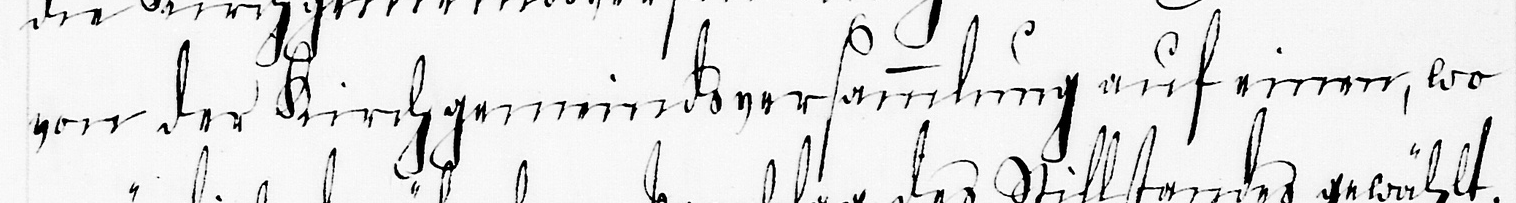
von der Kirchgemeindsversammlung auf einen, wo
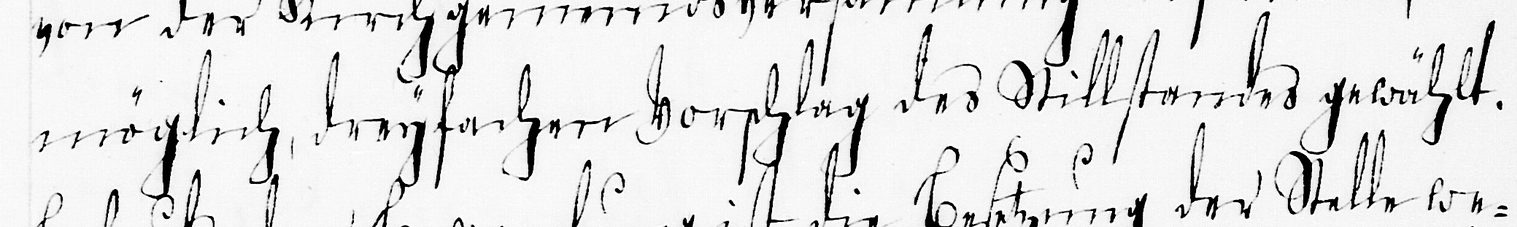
möglich, dreyfachen Vorschlag des Stillstandes gewählt.
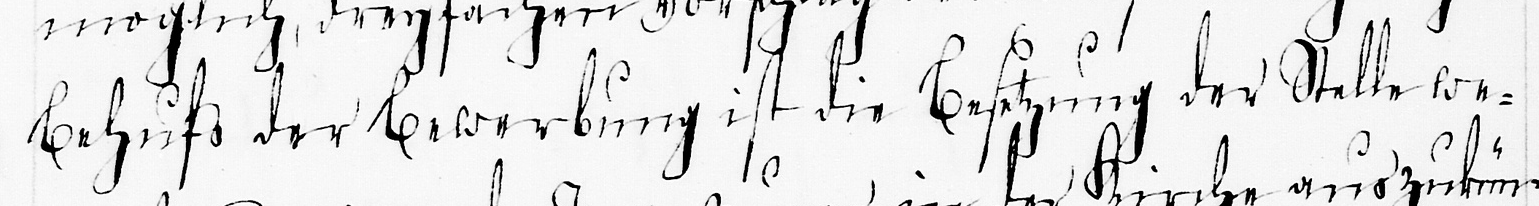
Behufs der Bewerbung ist die Besetzung der Stelle we¬
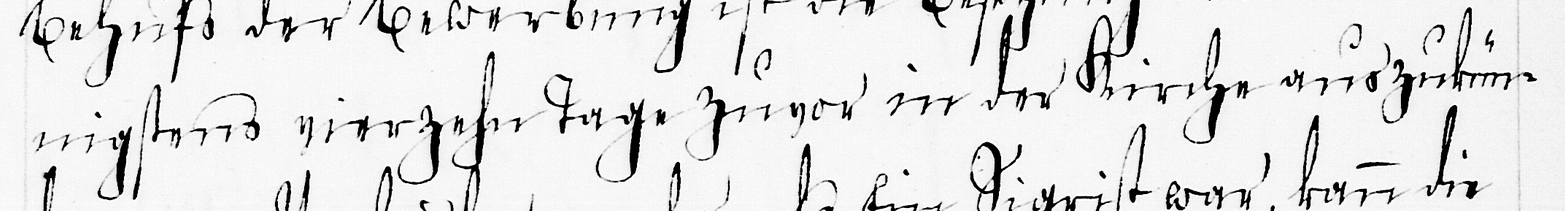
nigstens vierzehn Tage zuvor in der Kirche auszukün¬
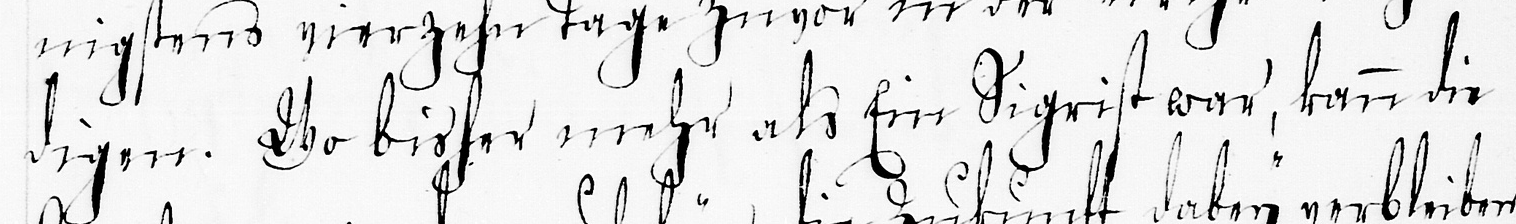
digen. Wo bisher mehr als Ein Sigrist war, kann die
